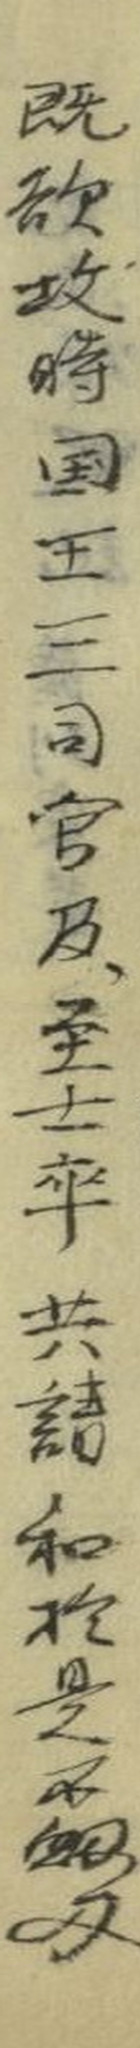既欲攻時国王三司官及至士卒共請和於是不剣刃
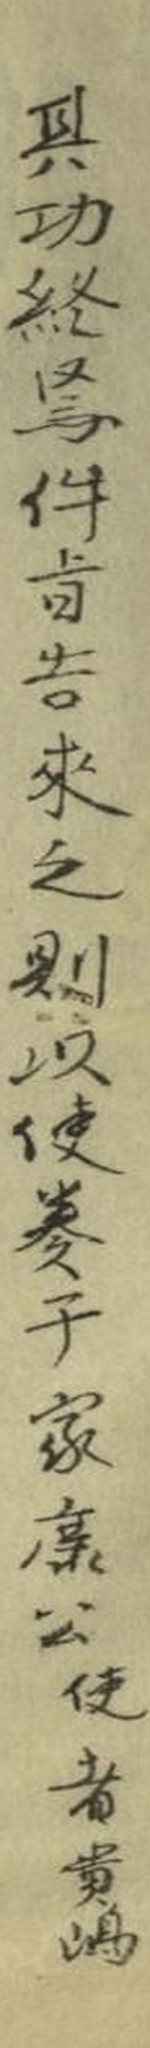其功終焉件旨告来之則以使奏于家康公使者貴島
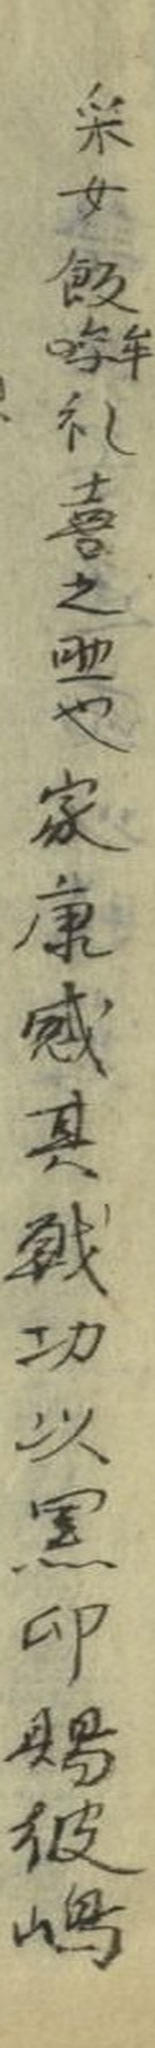采女飯牟礼喜之助也家康感其戦功以黒印賜彼島
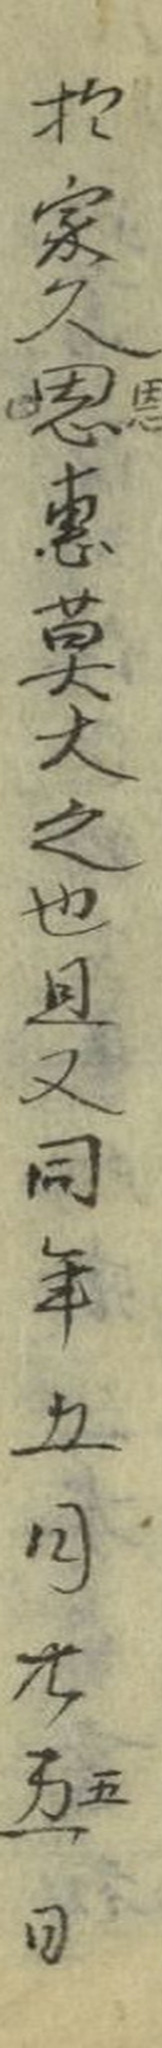於家久恩恵莫大之也且又同年五月廿五日
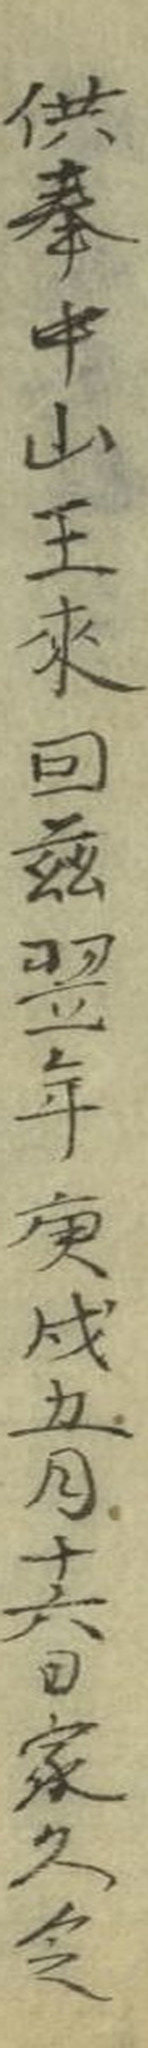供奉中山王来因茲翌年庚戌五月十六日家久定
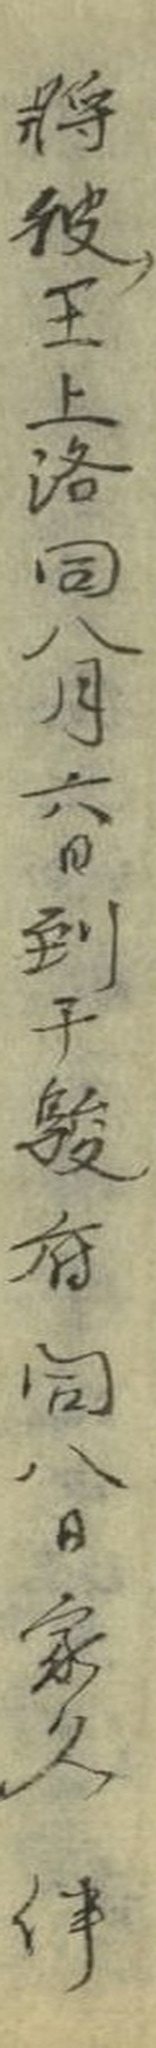将彼王上洛同八月六日到于駿府同八日家久伴
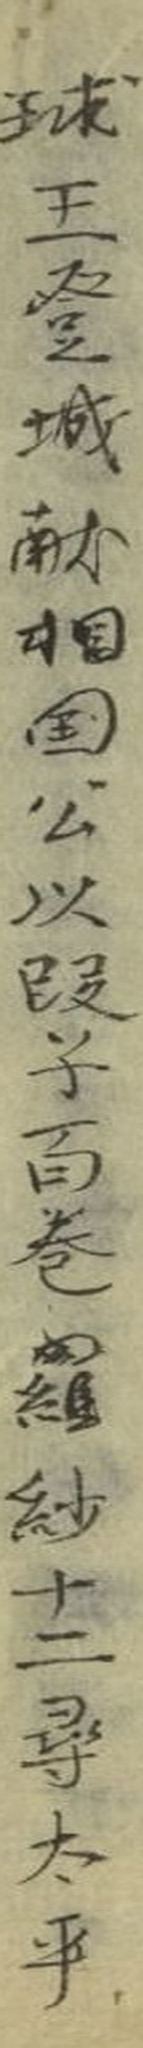球王登城献相国公以段子百巻羅紗十二尋太平
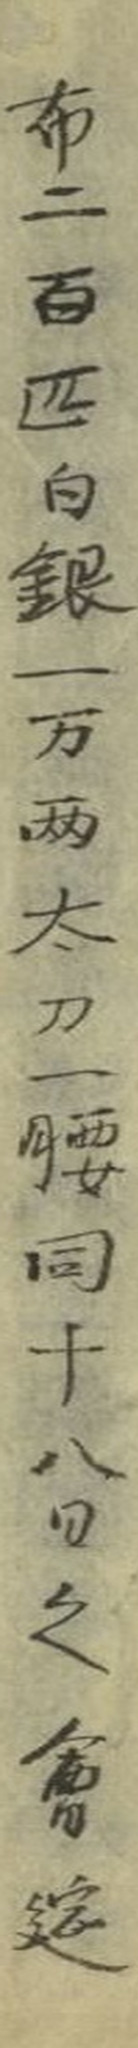布二百匹白銀一万両太刀一腰同十八日之会
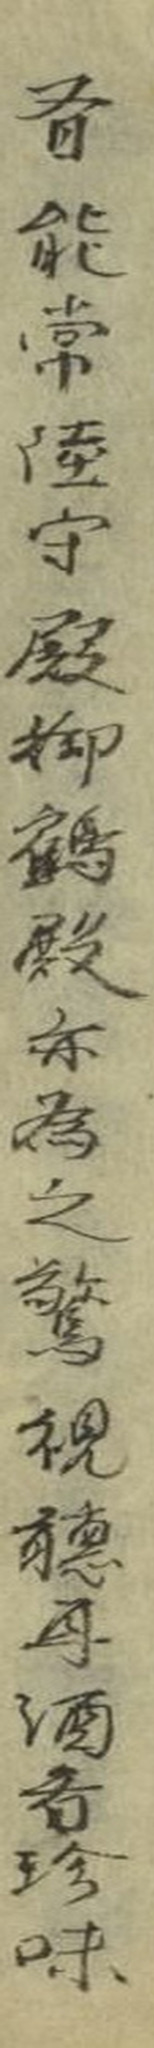能常陸守殿御鶴殿亦為之警視聴再酒肴珍味
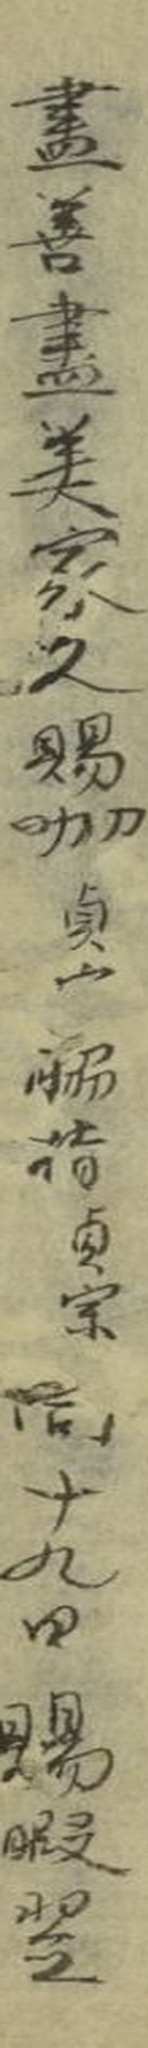尽善尽美家久賜貞脇指貞宗同十九日賜暇翌
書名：琉球紀事
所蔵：University of the Ryukyus Library
